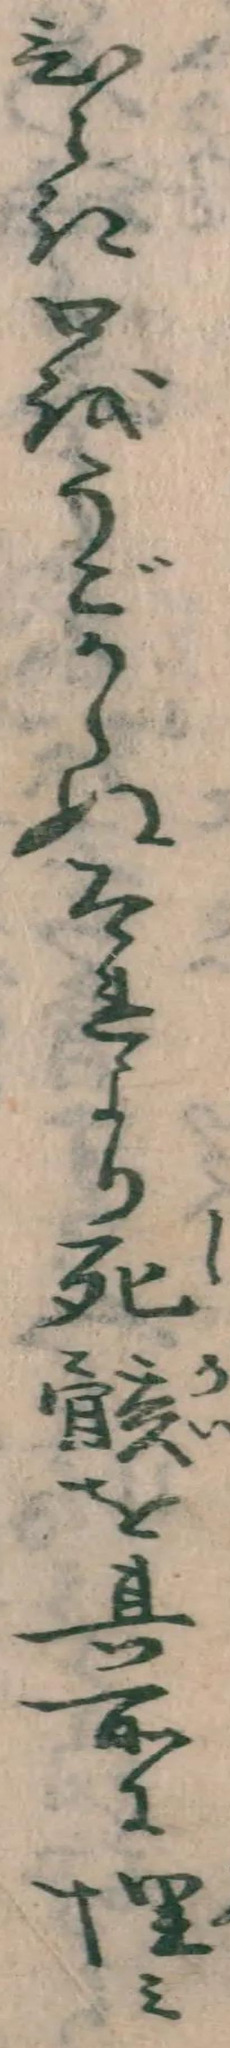ひらき口をうごかしぬそれより死骸を其所に埋み
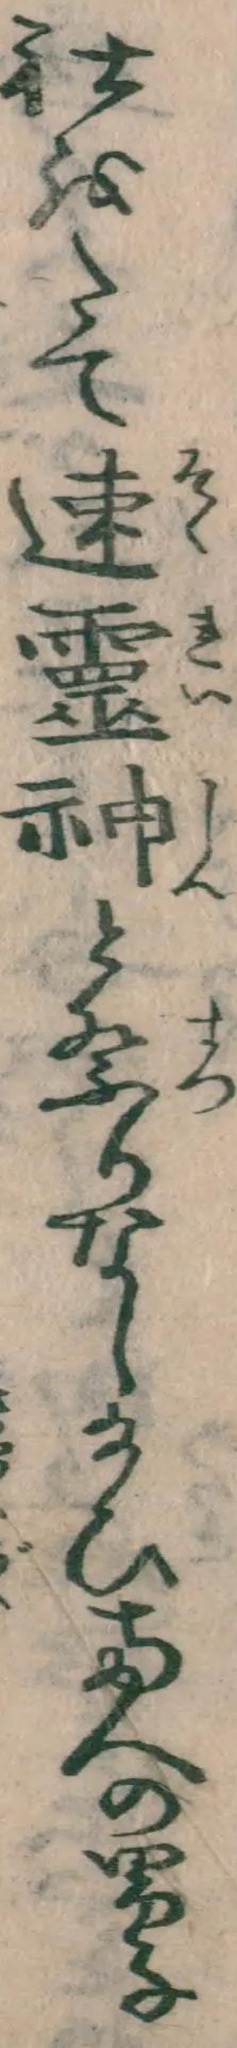社をたて速霊神と祭りなし給ひ両人の男子
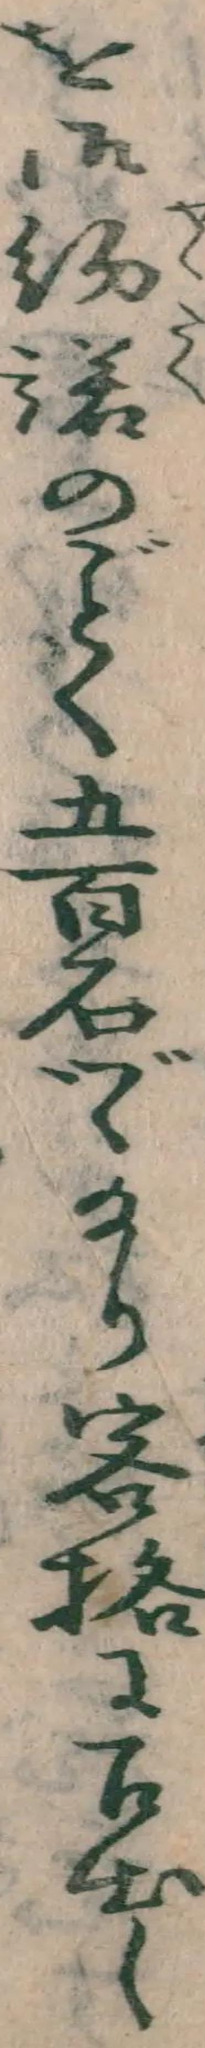を御約諾のごとく五百石づゝ給り客挌に召出し
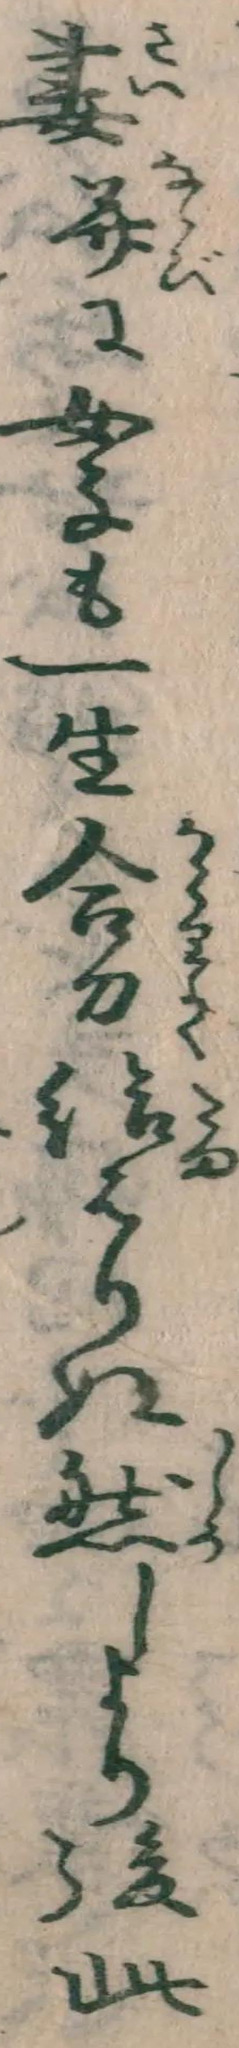妻并に女子も一生合力給はりぬ然しより後此
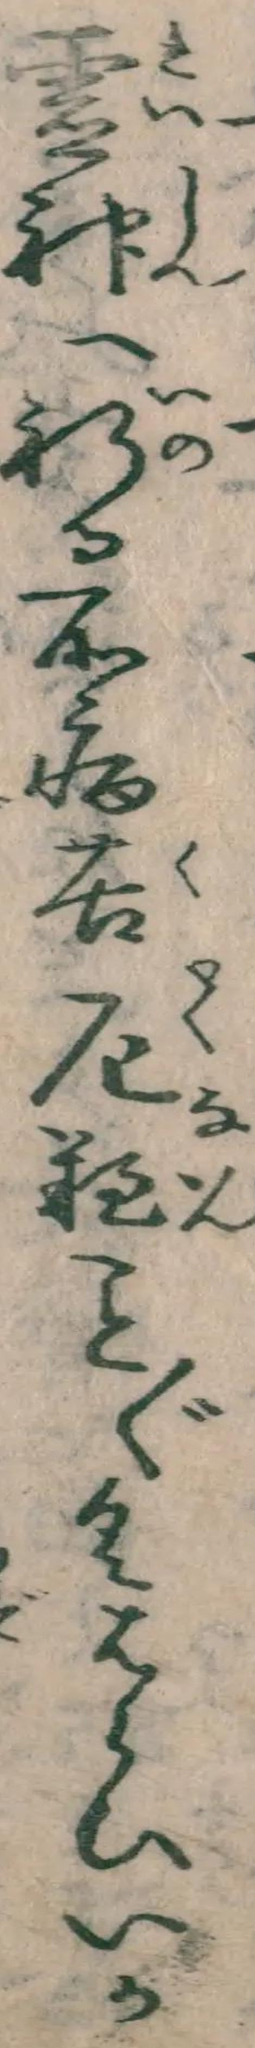霊神へ祈る所病苦厄難こと〴〵くはらひいか
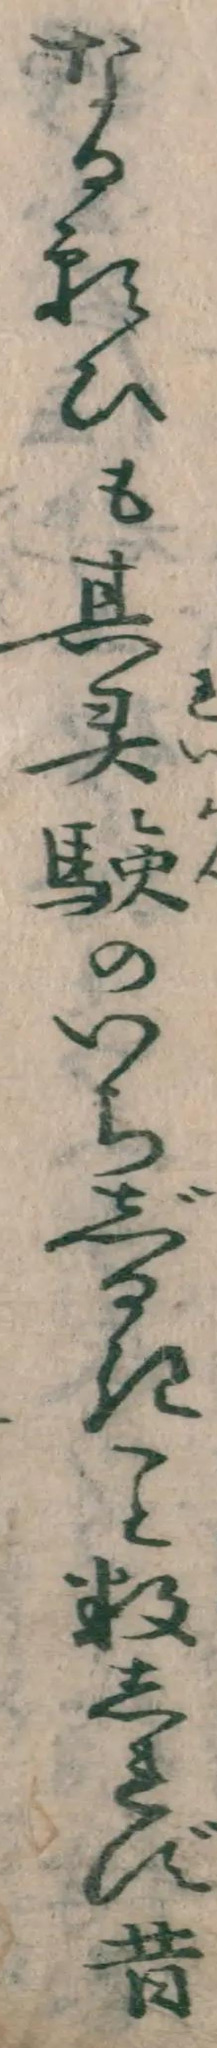なる願ひも其霊験のいちじるきこと数しれず昔
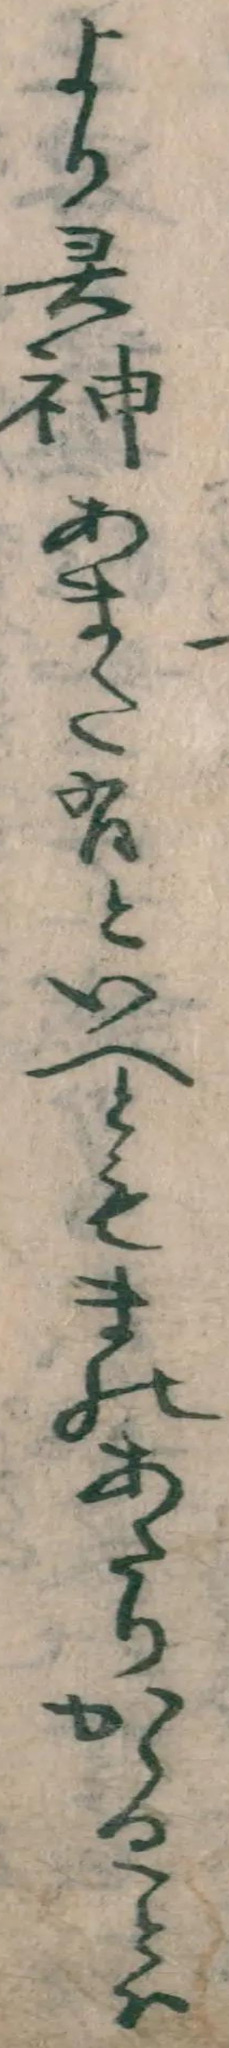より霊神あまた有といへともまのあたりかゝることは
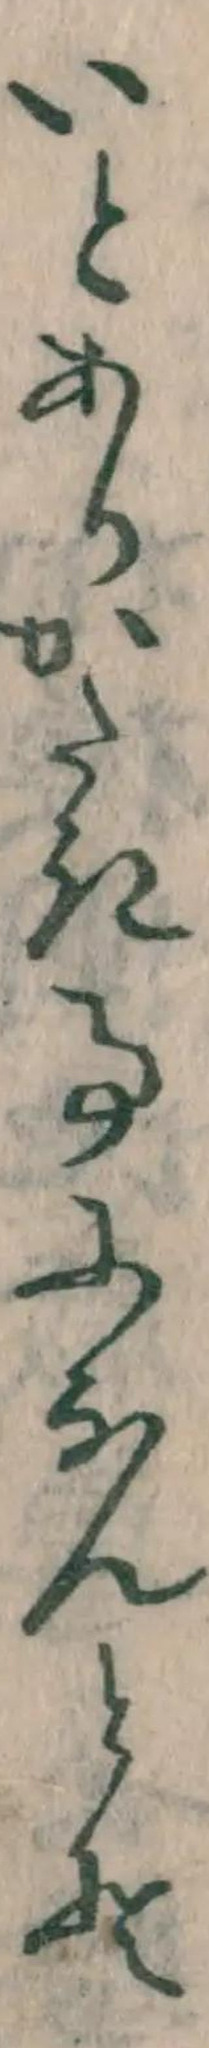いとありかたき事になんとそ
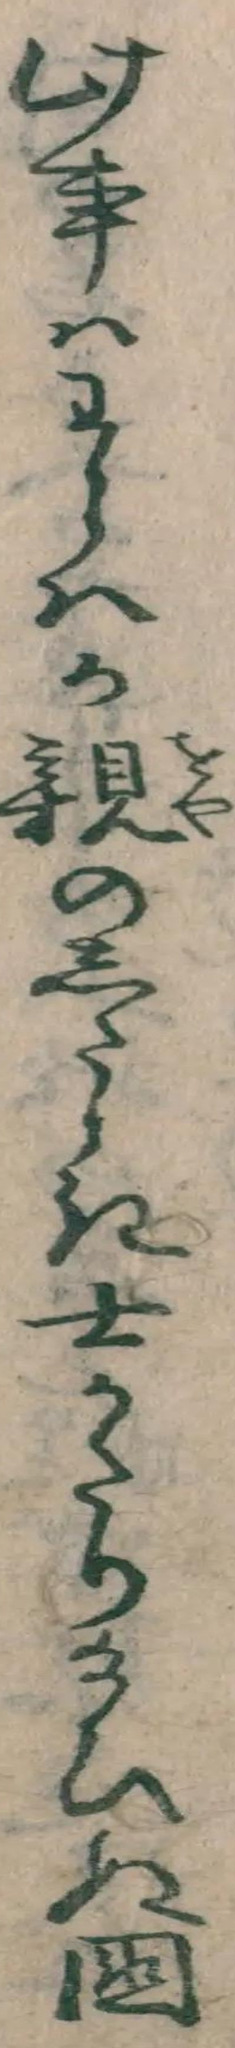此事はわらはか親のしたしき士かたり給ひぬ国

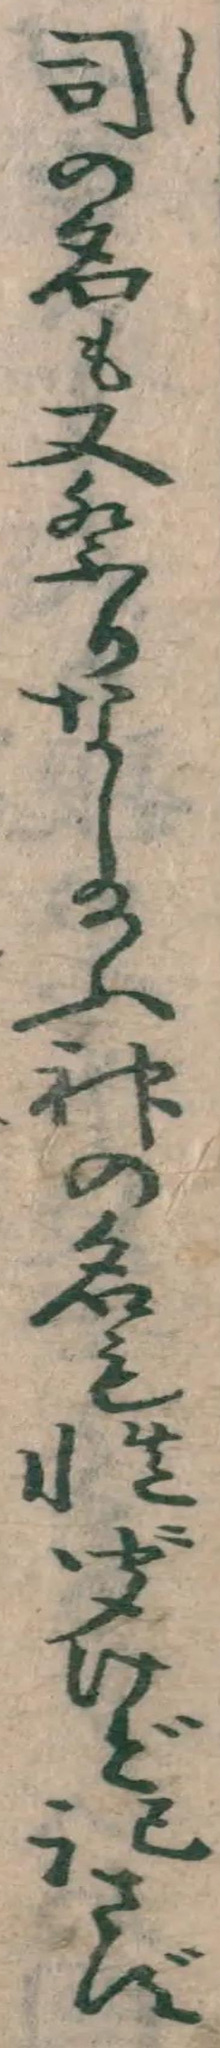司の名も又祭りなし給ふ神の名も慥聞けど記さず
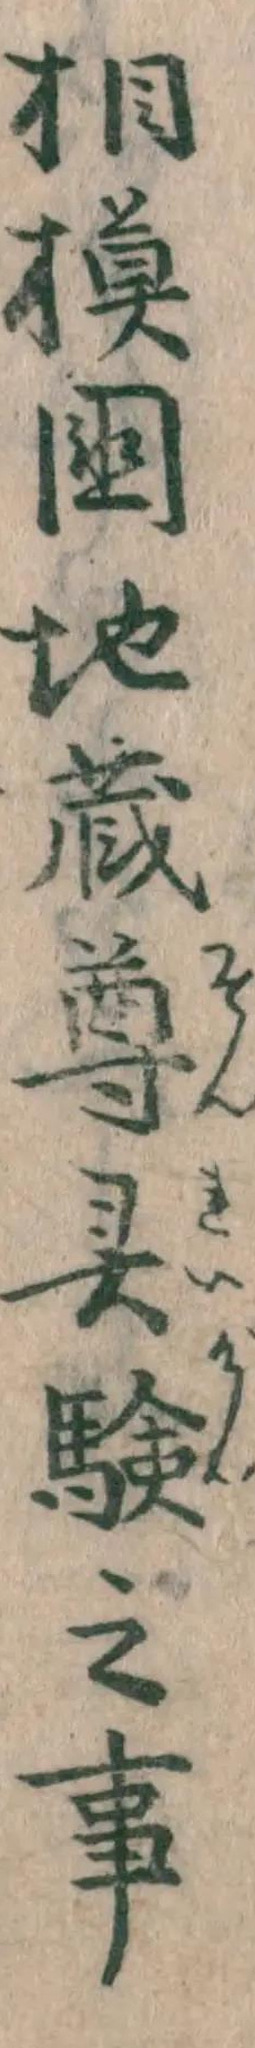相模国地蔵尊霊験の事
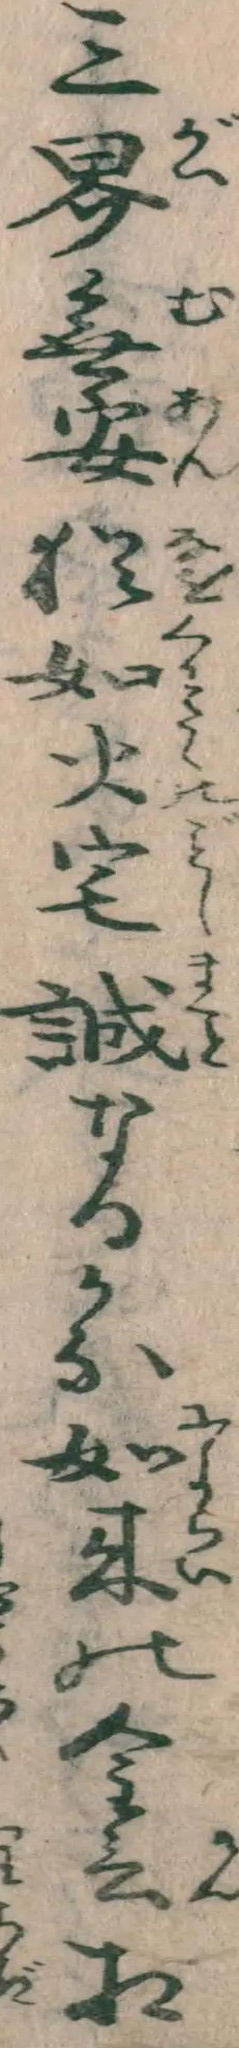三界無安猶如火宅誠なるかな如来の金言相
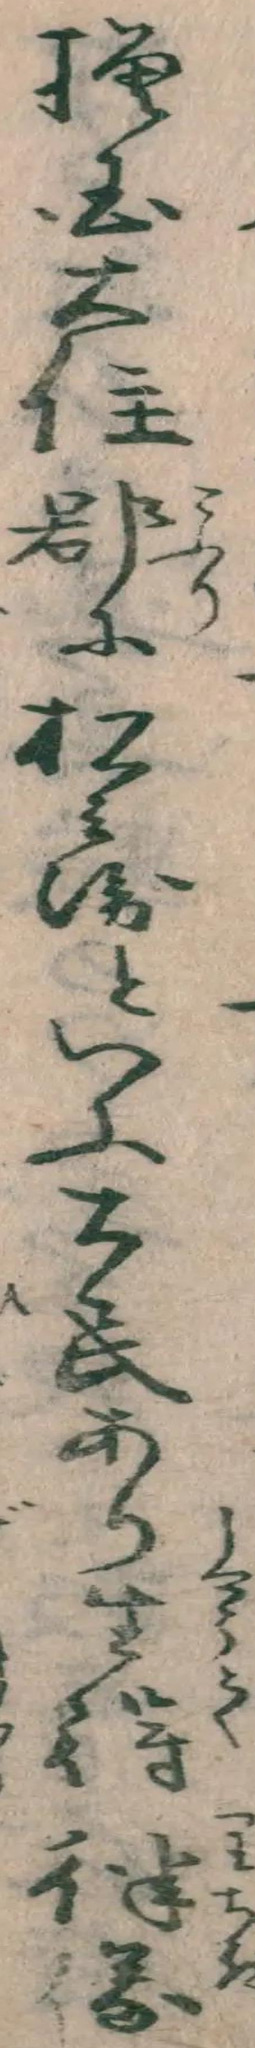模国大住郡に松兵衛といふ土民あり生得律義
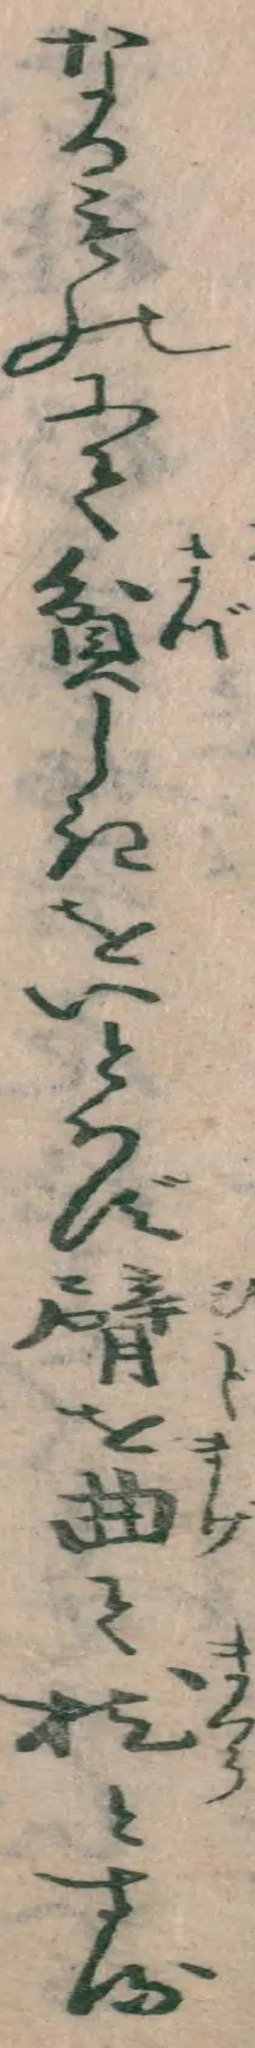なるものにて貧しきをいとはず臂を曲て枕とする
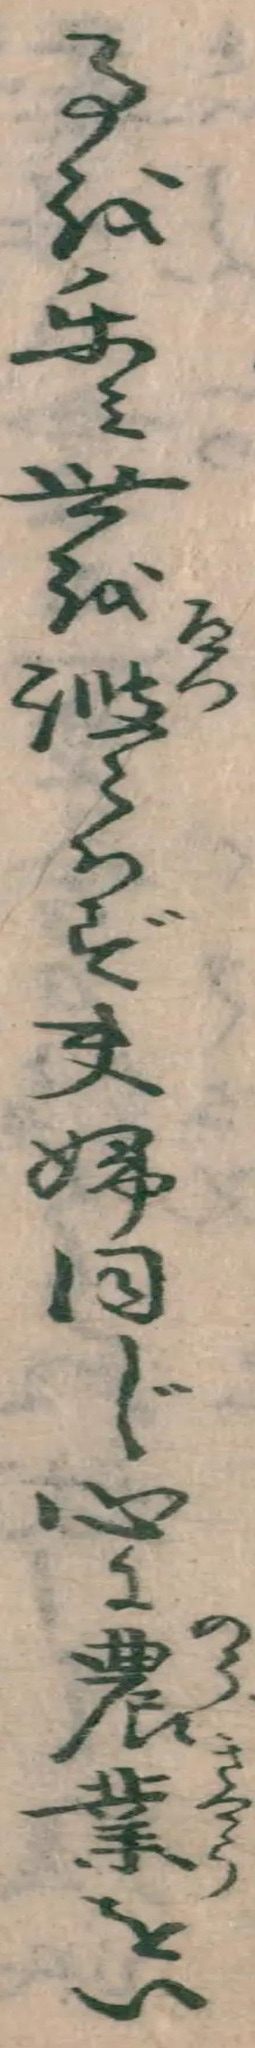事を楽み世を諛らはず夫婦同じ心に農業をい
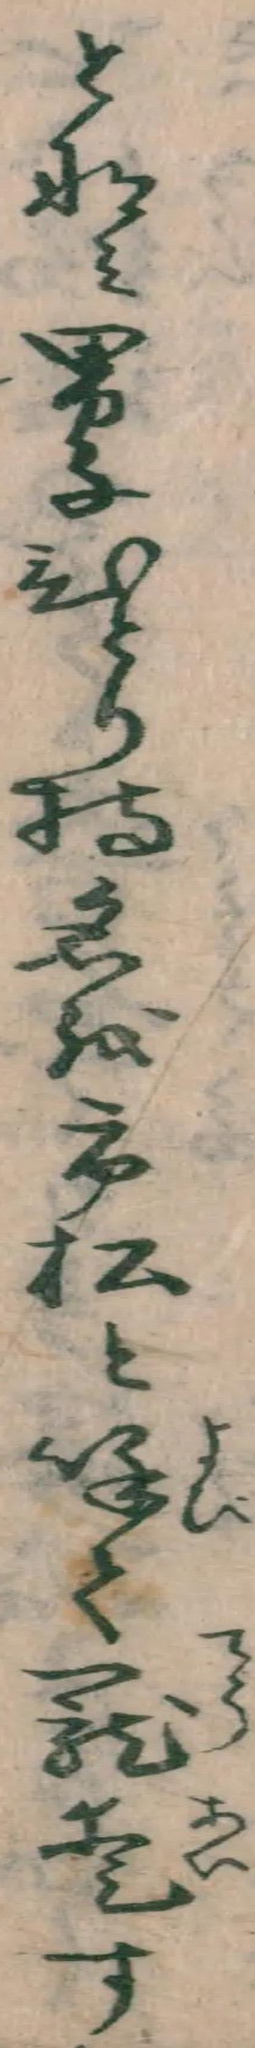となみ男子ひとり持名を市松と呼て寵愛す
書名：怪談御伽童 5巻. [1]
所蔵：国立国会図書館 National Diet Library, JAPAN
